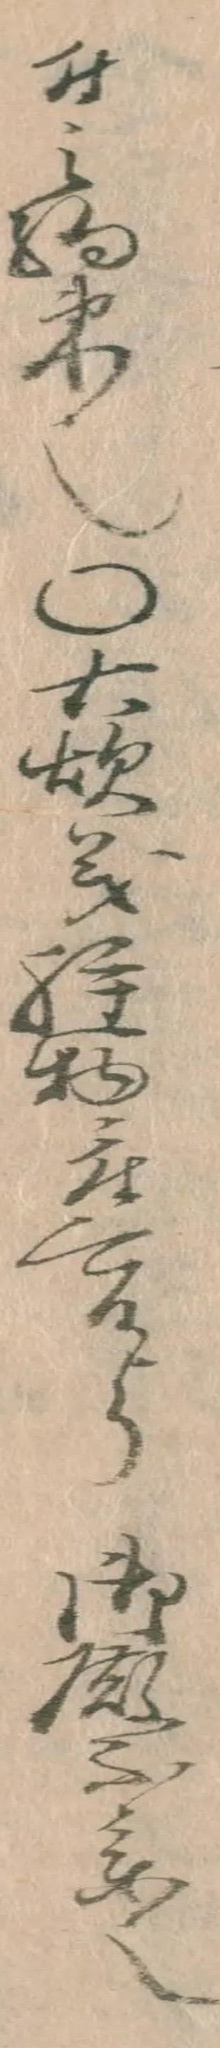付之約束也○大炊義腫物ニ付今日より御殿不参也
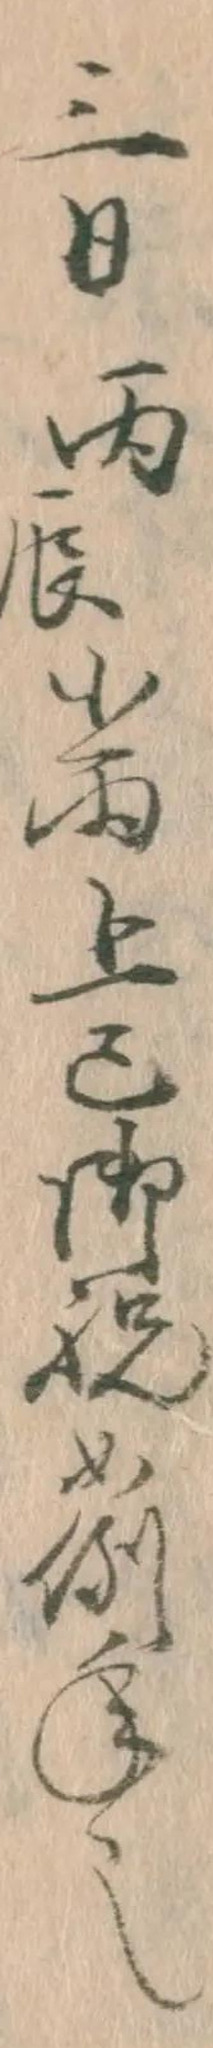三日丙辰小雨上巳御祝如例年也
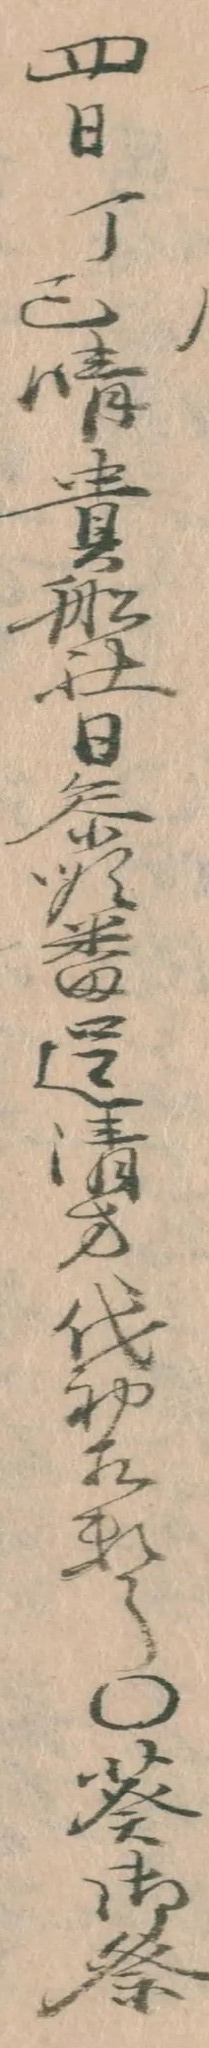四日丁巳晴貴舩社日参順番逞清方代勤相頼了○葵御祭
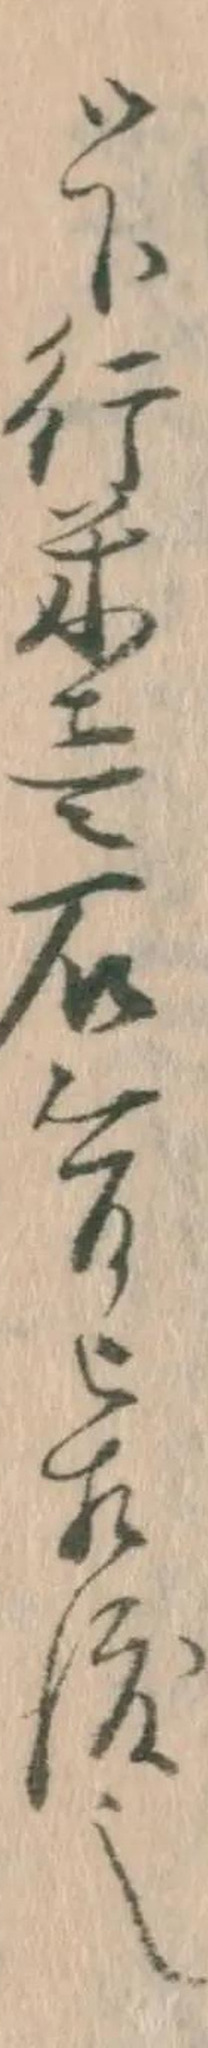御下行米壱石今日被相渡也
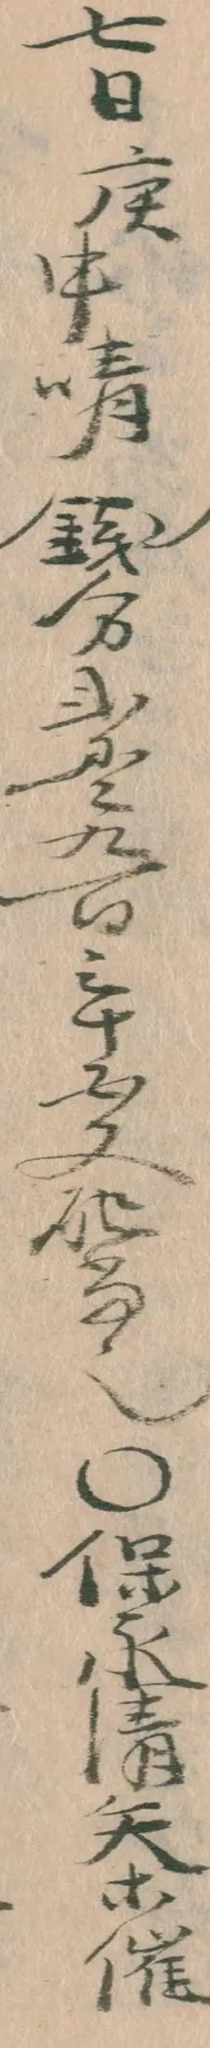七日庚申晴銭分弐貫九百三十五文配當也○保永清矢等催
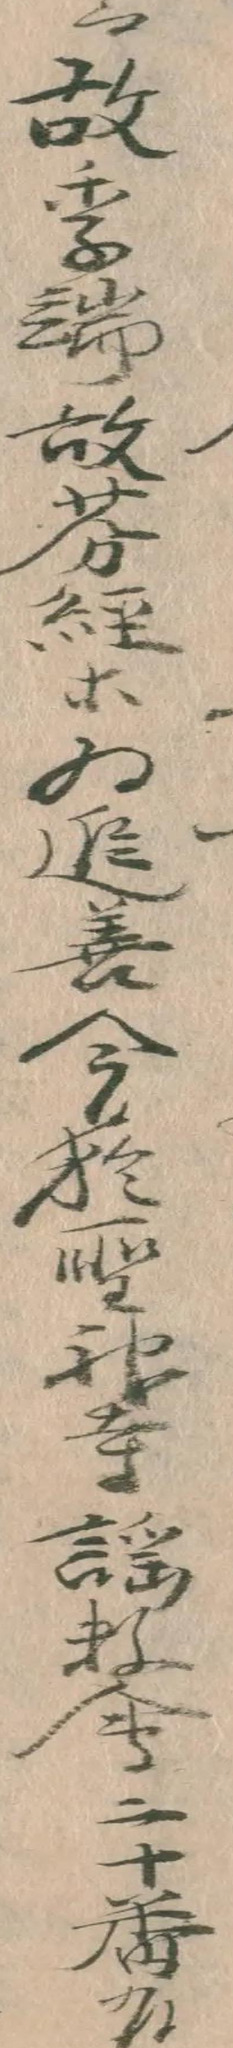ニ而故季端故芬経等為進善今日於聖神寺謡数會二十番有
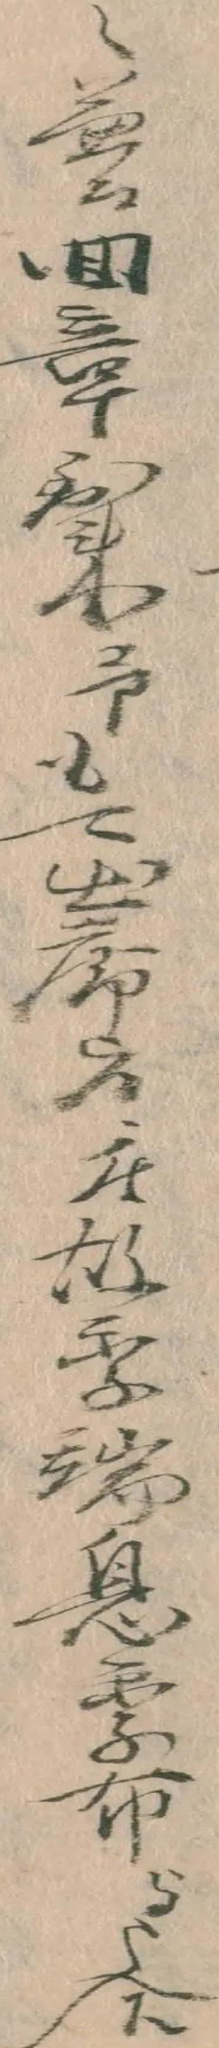之兼而回章到来予も可出席旨ニ付故季端息季布と申合
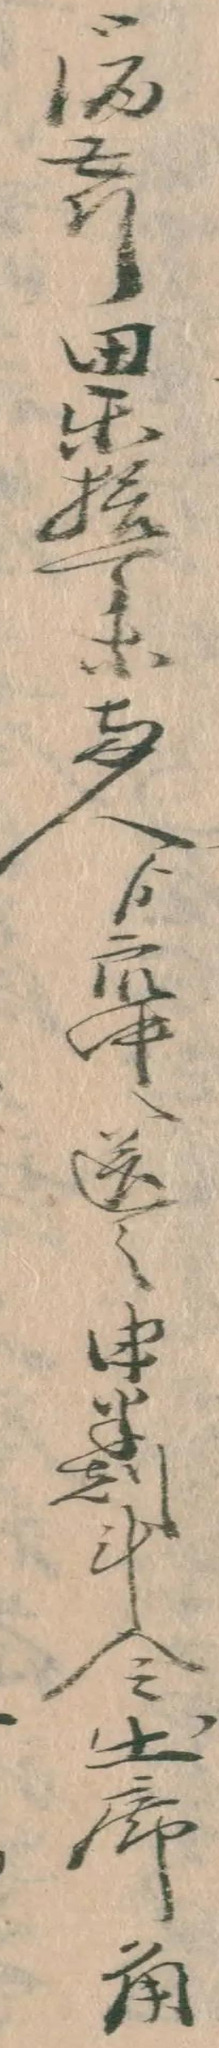御酒五升田楽膳丁等両人ゟ衆中へ送之申半刻斗令出席角
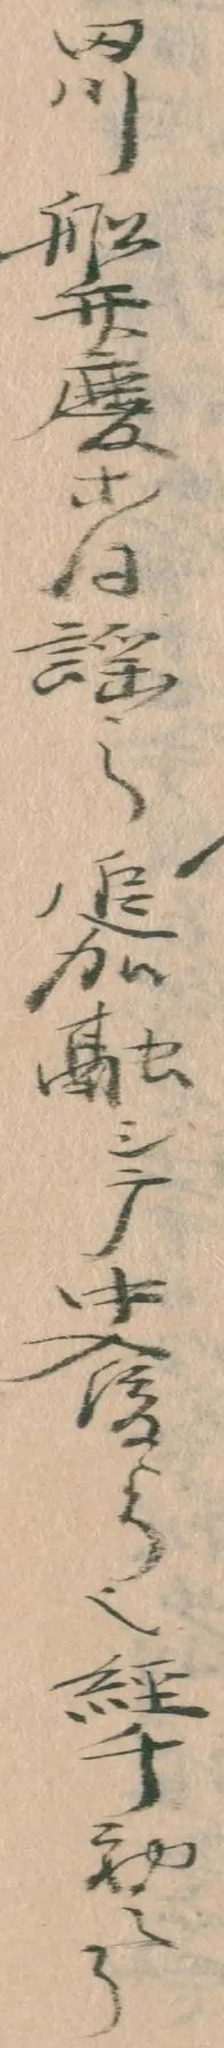田川舩弁慶等同謡也追加融シテ中入後より之経千勤之了
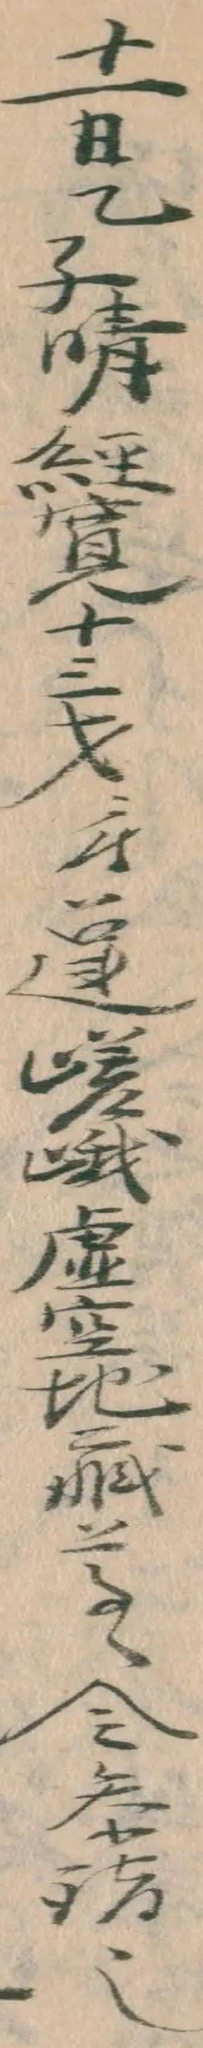十一日乙子晴経寛十三才ニ付召連嵯峨虚空地蔵尊へ令参詣也
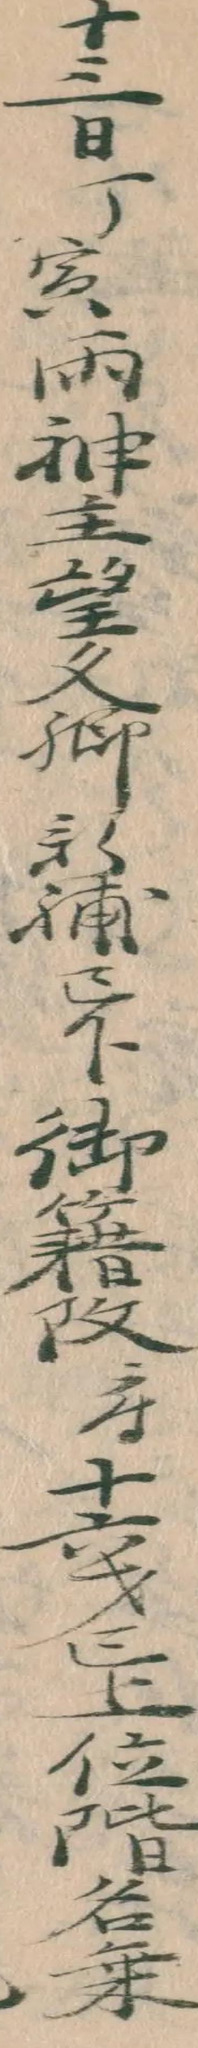十三日丁寅雨神主望久卿新補已下御籍改ニ付十六才已上位階名乗
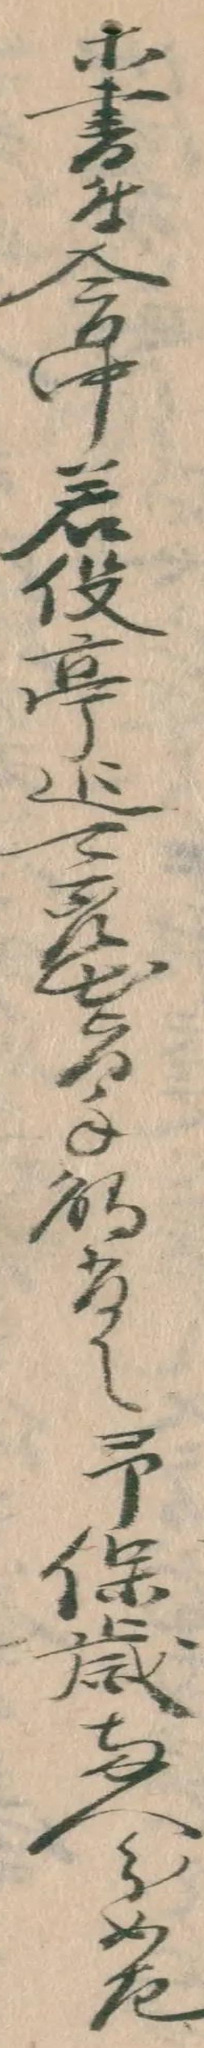等書付今日中若役亭迄可差出旨手触有之予保歳両人分如左
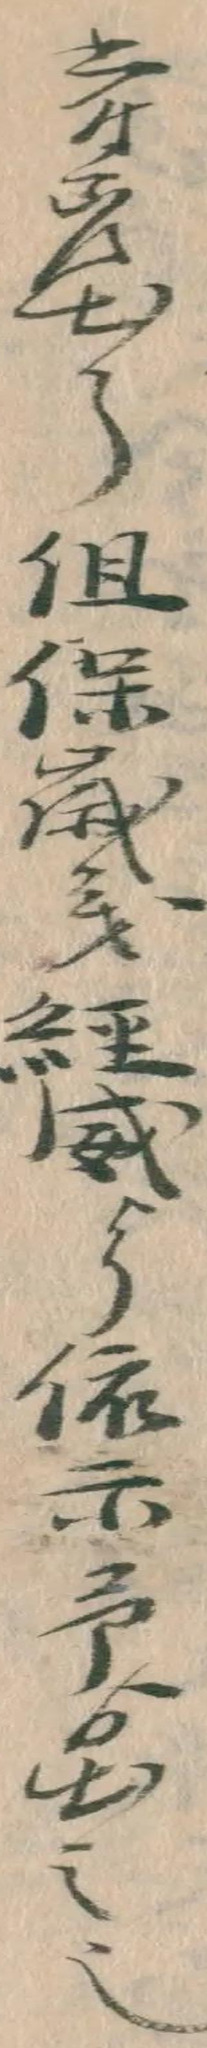書付差出了但保歳義経威より依示予ゟ出之也
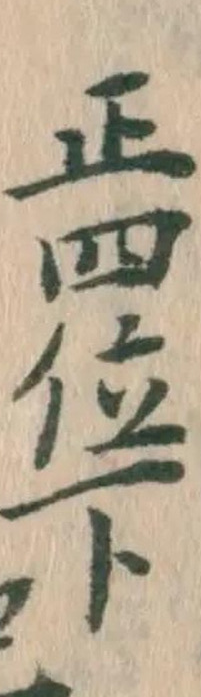正四位下
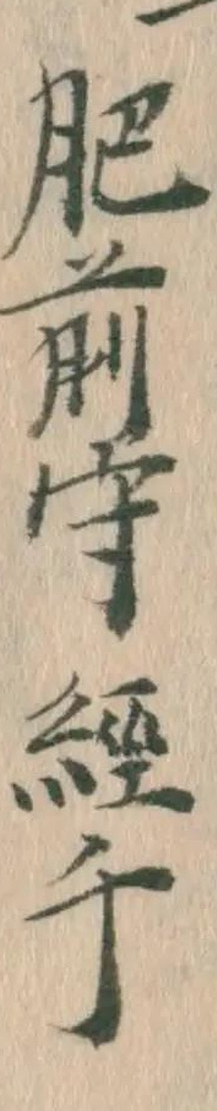肥前守経千
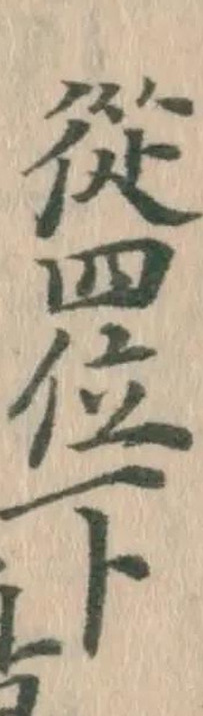従四位下
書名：賀茂社記録. 第66冊
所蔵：国立国会図書館 National Diet Library, JAPAN
